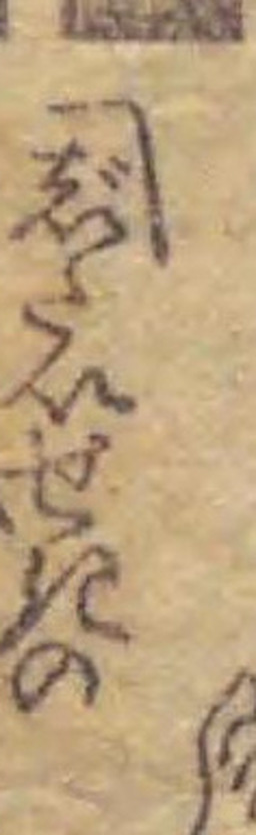〽じたいせきの
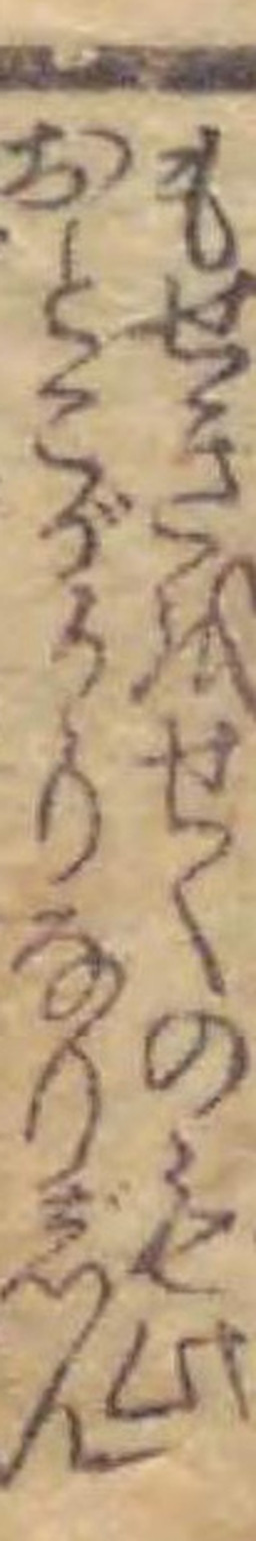おとこがゝりなりじん
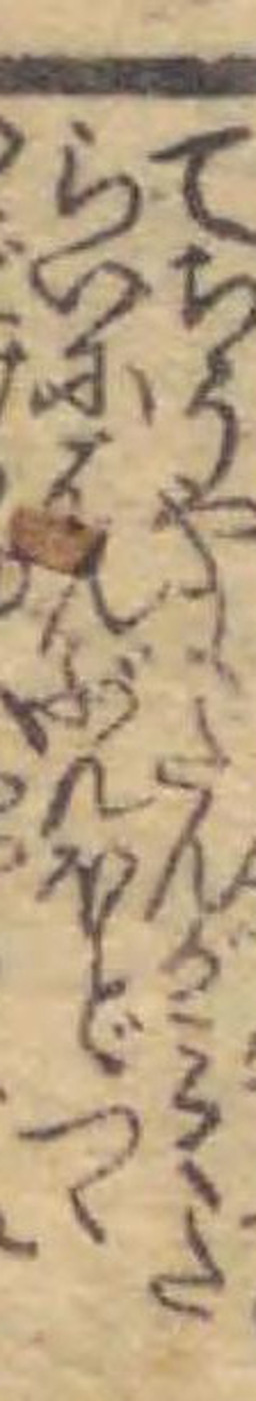らいにはんぶんほどつゝ
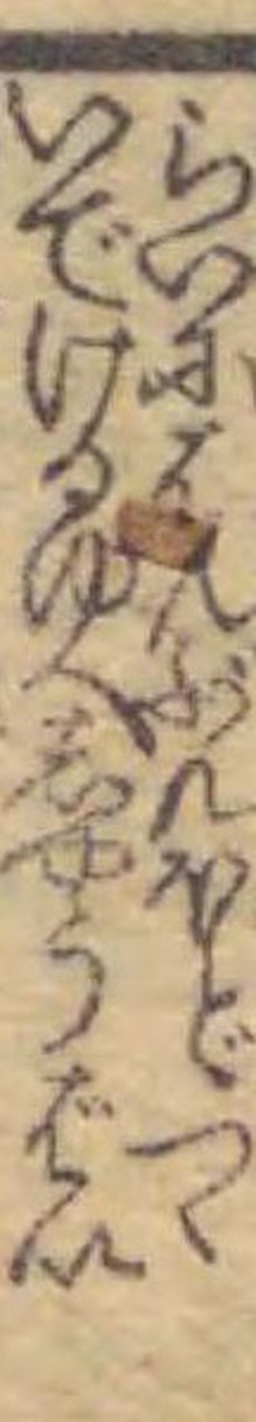いでけるゆへしやうばい
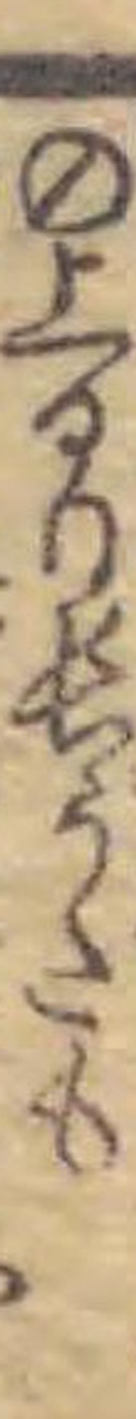の上るり長うたも
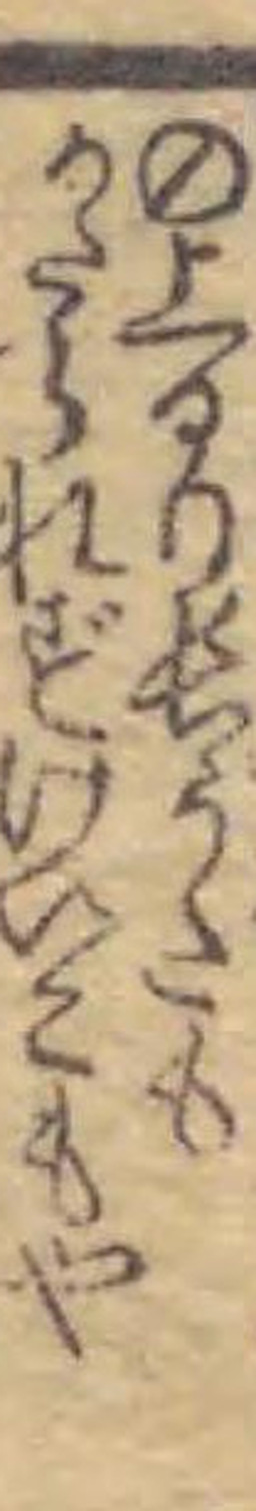かたられずけいこもや
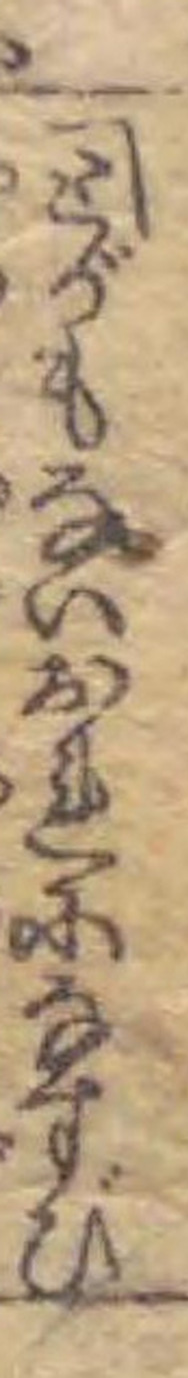〽とがもないおれになすび
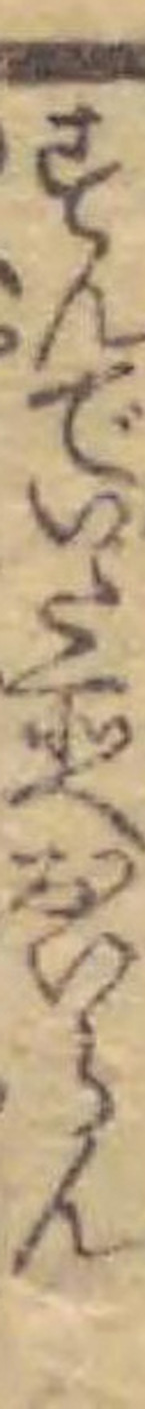すんでいた所へおいらん
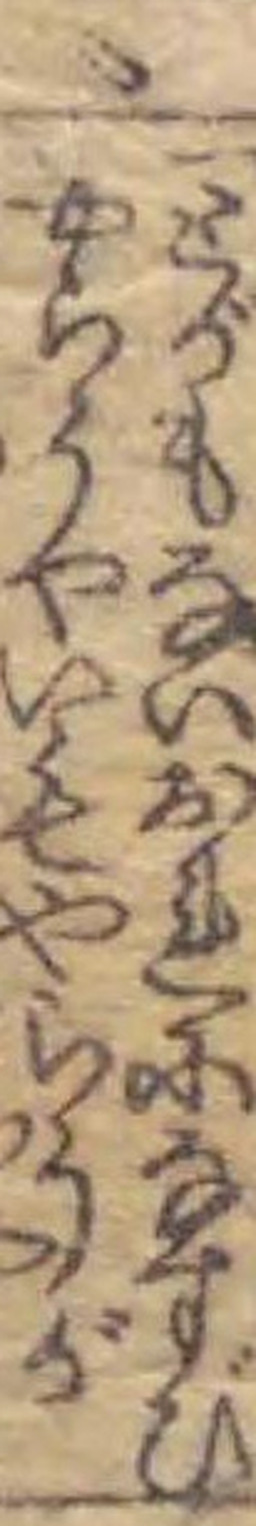やらうやいもやらうが
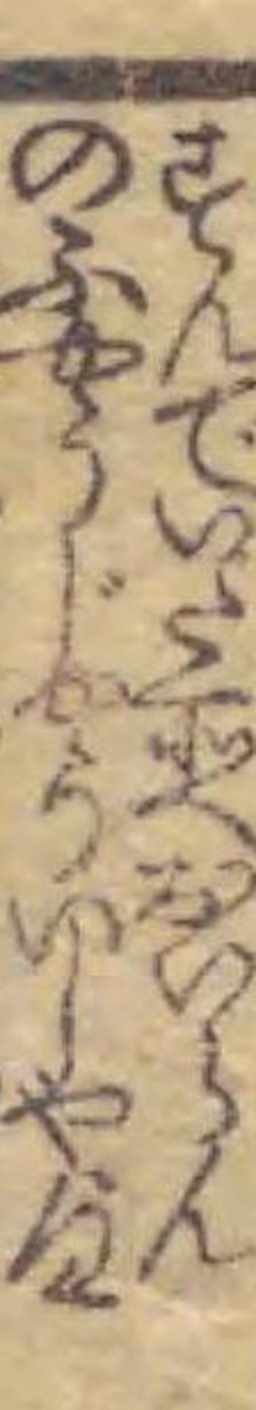のふやうじやういしやへ
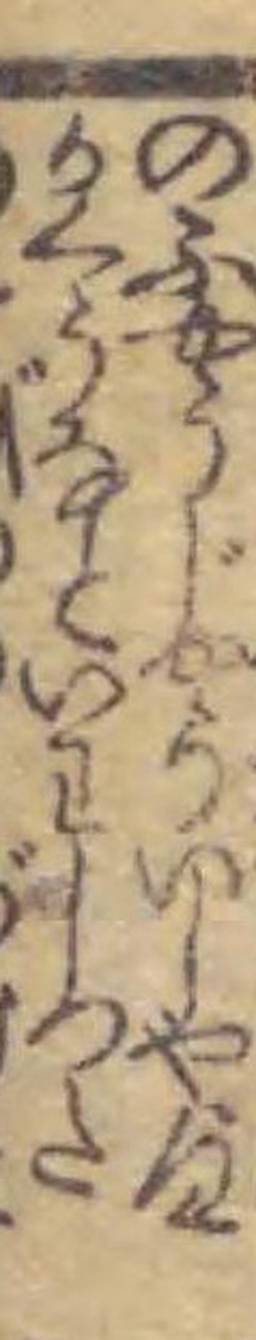かくうなといわしつた
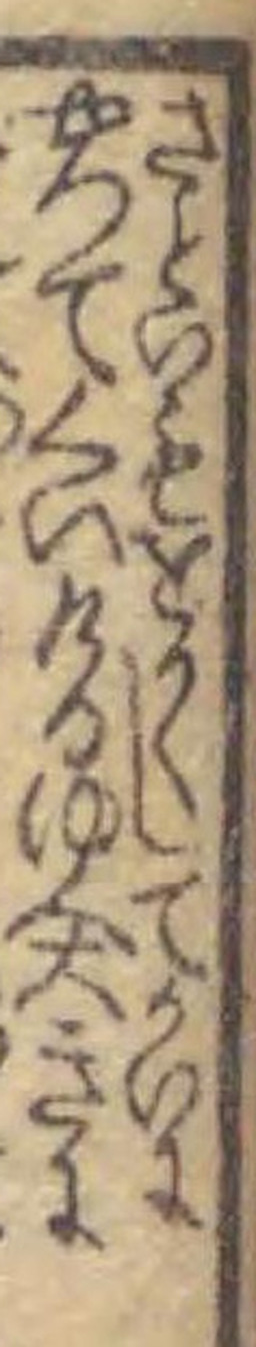やつてくいけるゆへ大きに
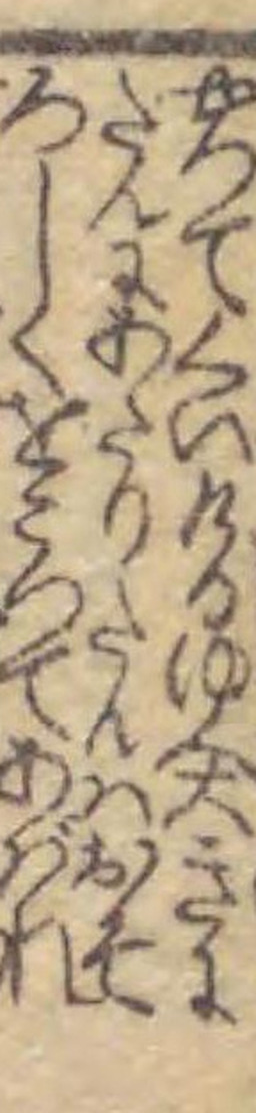ろしくをこつてあばれ
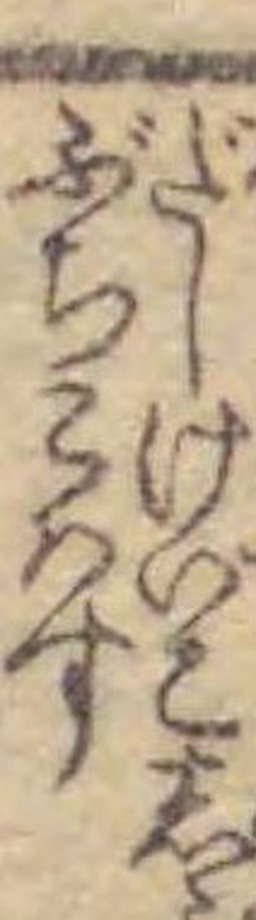ぶちこはす
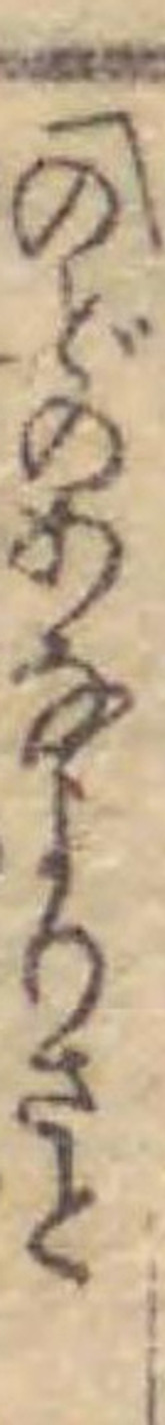〽のどのあなよりさと
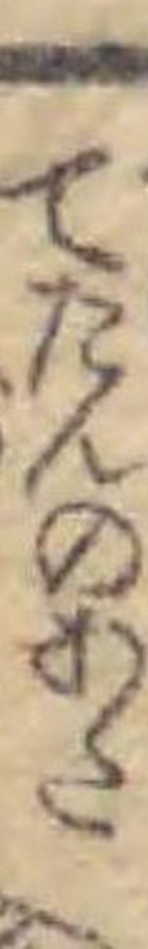てたんのあた
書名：十四傾城腹之内 : 3巻
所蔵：国立国会図書館 National Diet Library, JAPAN
